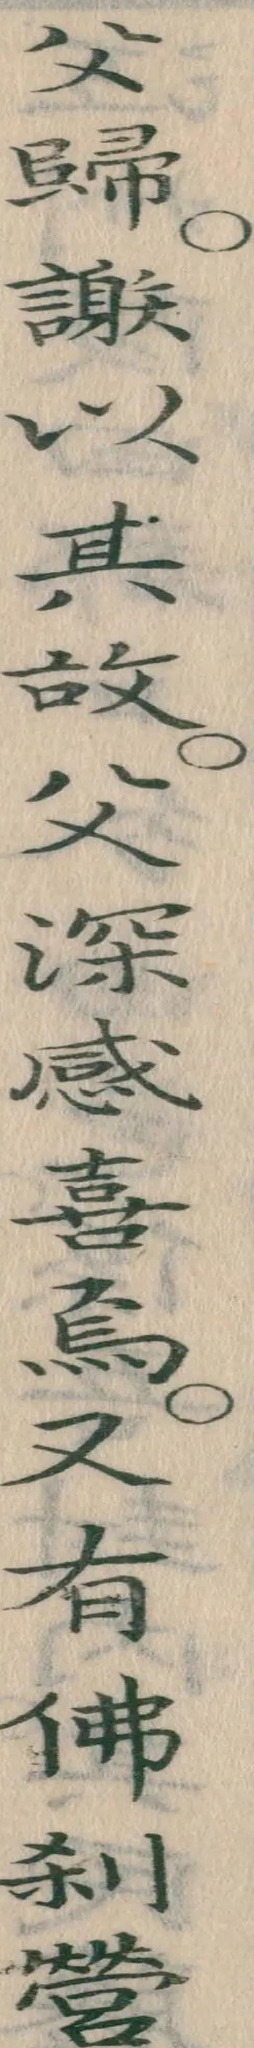父帰。謝以其故。父深感喜焉。又有佛刹営
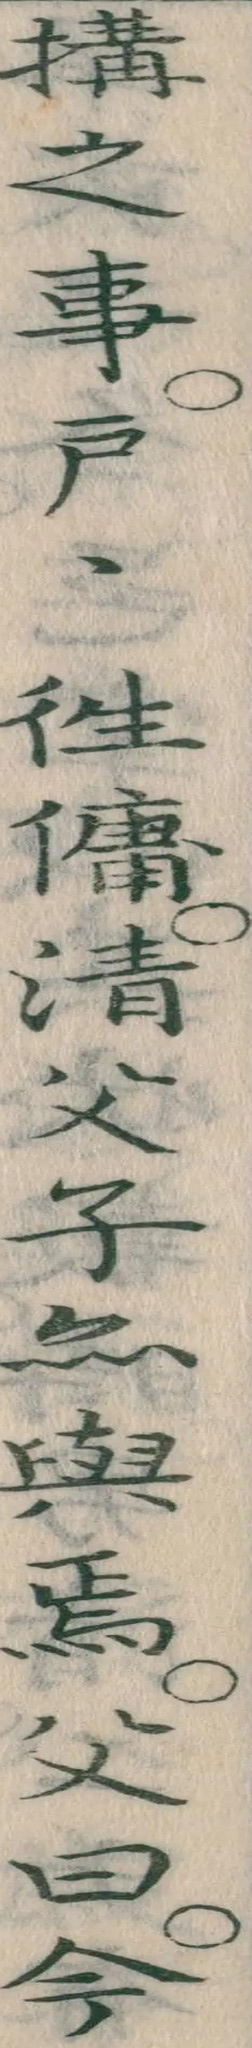搆之事。戸々往傭。清父子与焉。父曰。今
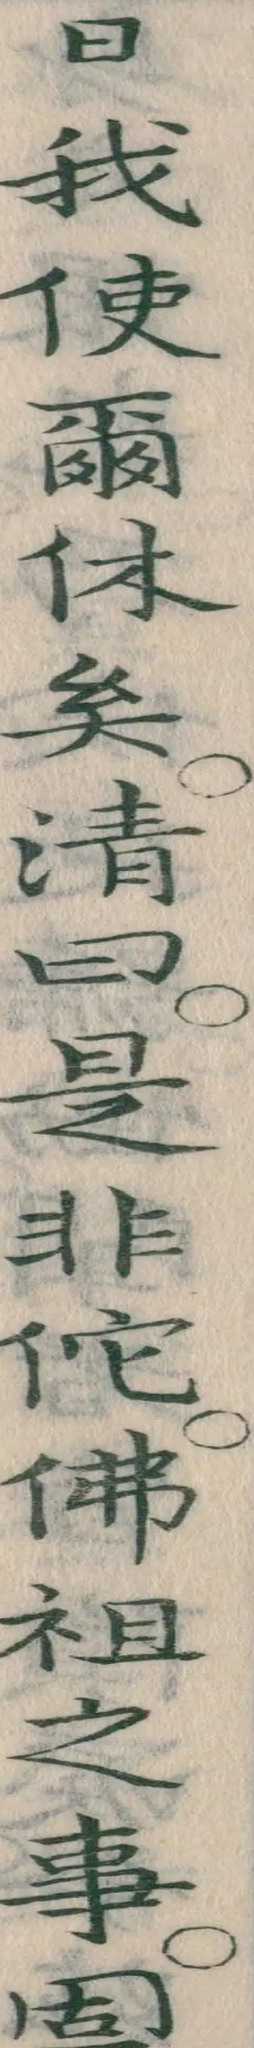日我使爾休矣。清曰。是非佗。仏祖之事。固
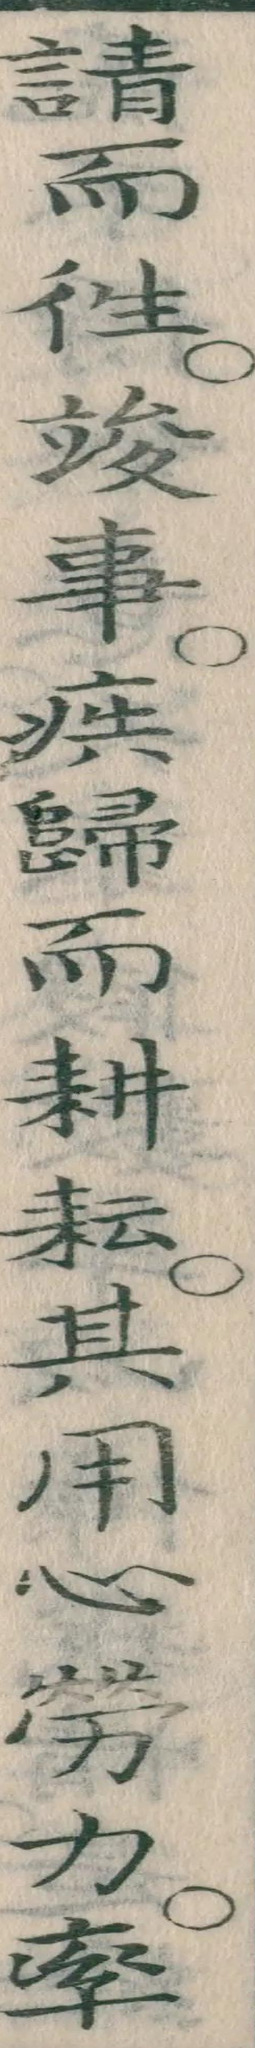請而往。竣事。疾帰而耕耘。其用心労力。率
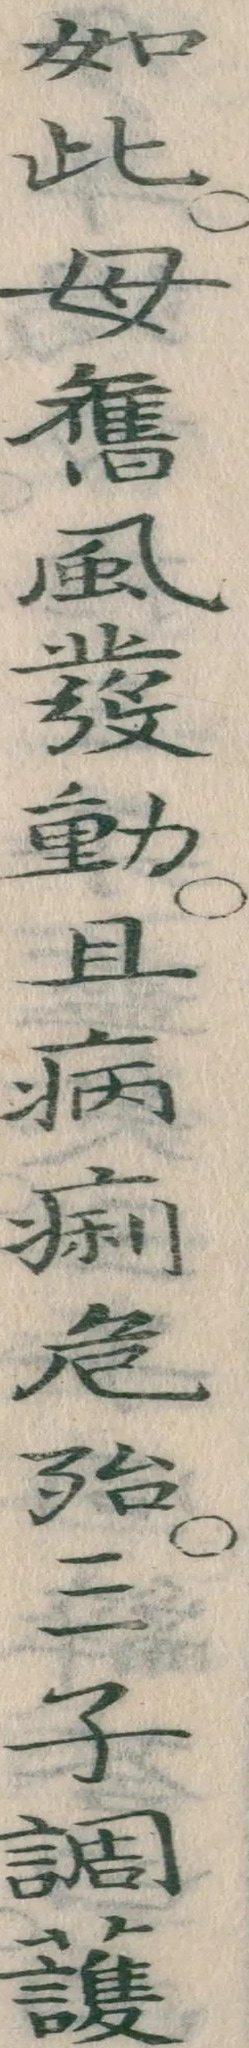如此。母風発動。且病痢危殆。三子調護
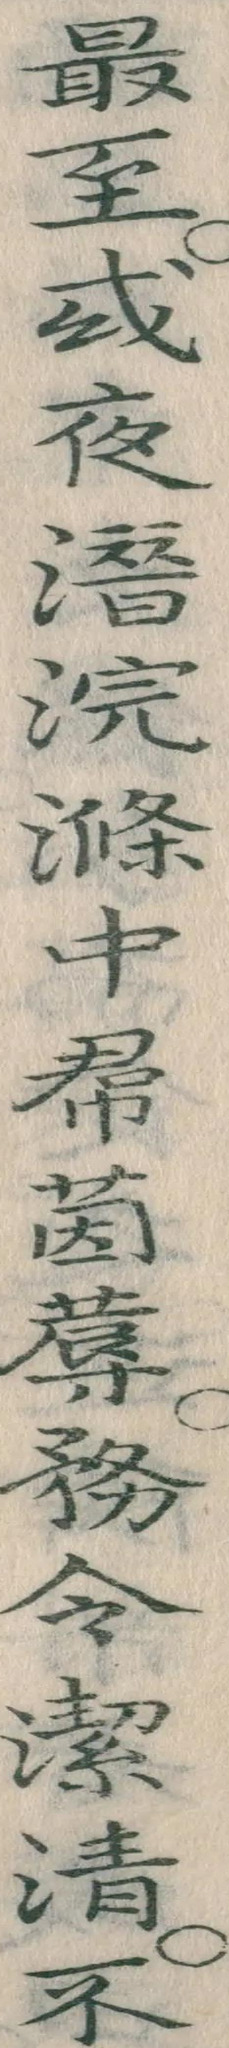最至。或夜潜浣滌中帬茵蓐務令潔清。不
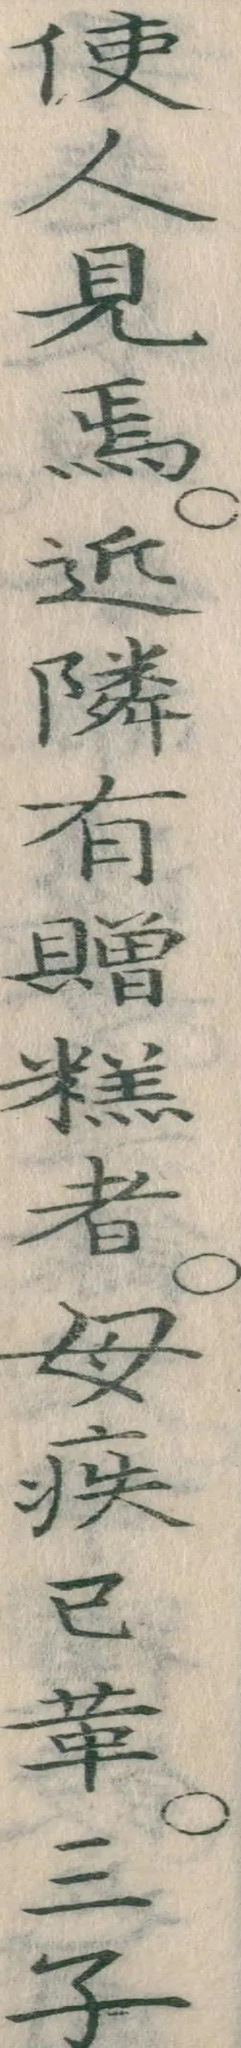使人見焉。近隣有贈糕者。母疾已革。三子
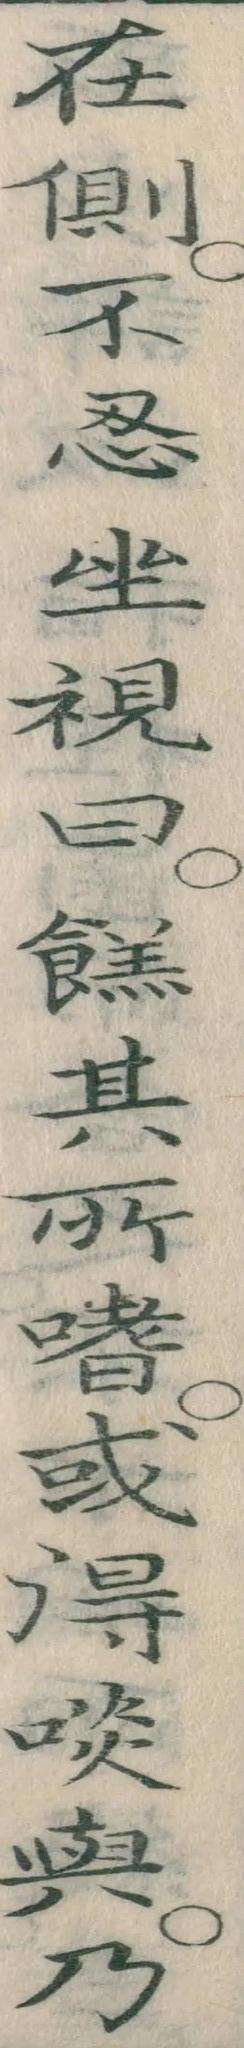在側。不忍坐視曰。餻其所嗜。或得啖与乃

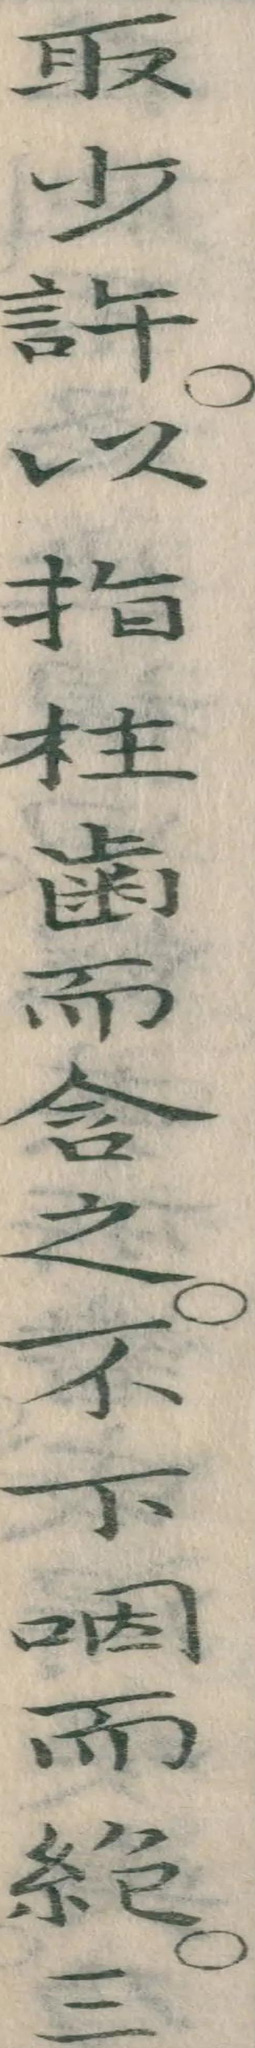取少許。以指柱歯而含之。不下咽而絶。三
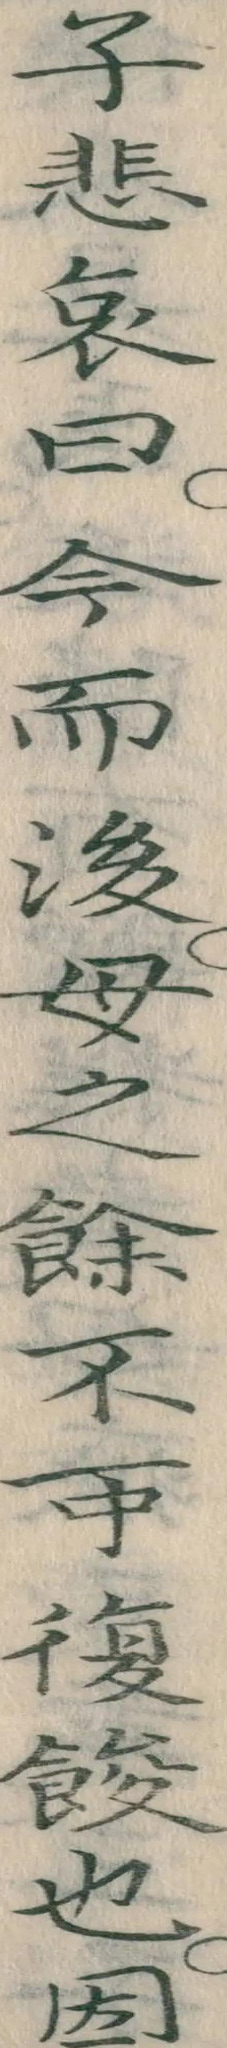子悲哀曰。今而後。母之余不復餕也。因
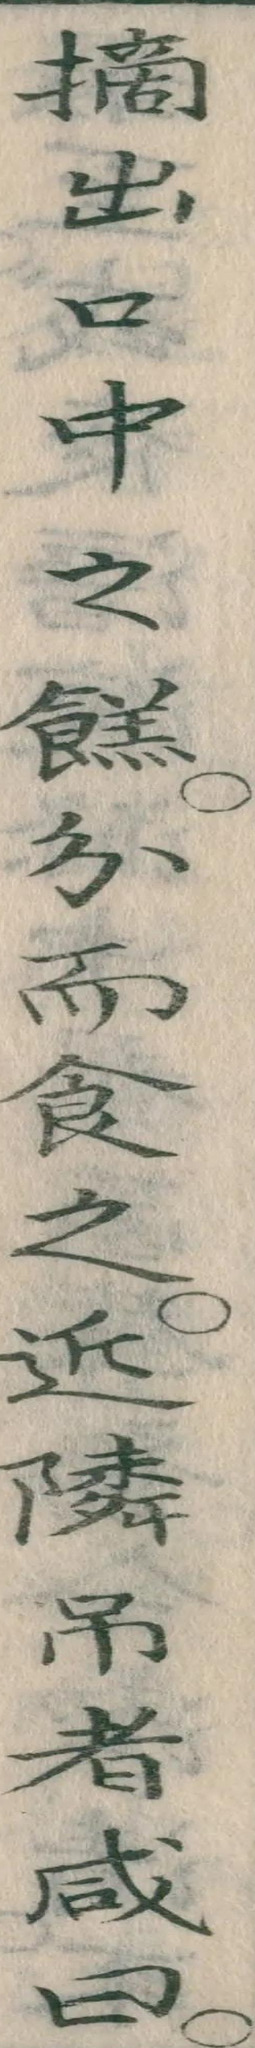摘出口中之餻。今而食之。近隣吊者咸曰。
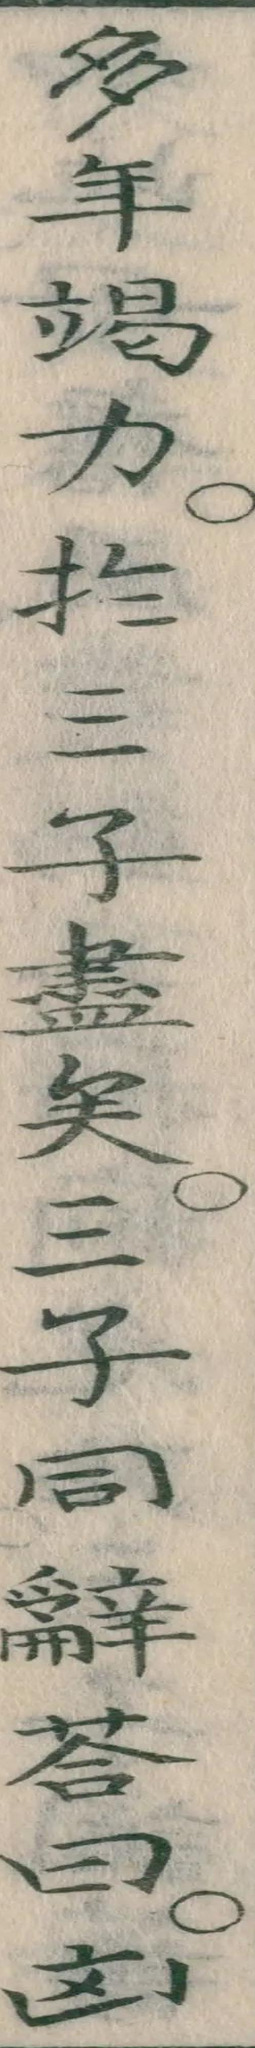多年竭力。於三子盡矣。三子同辞答曰。
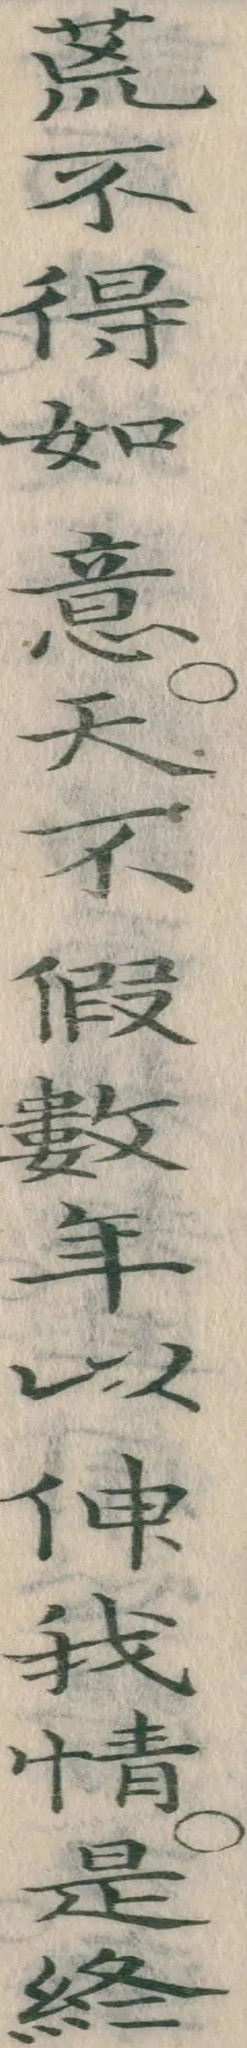荒不得如意。天不仮数年以伸我情。是終
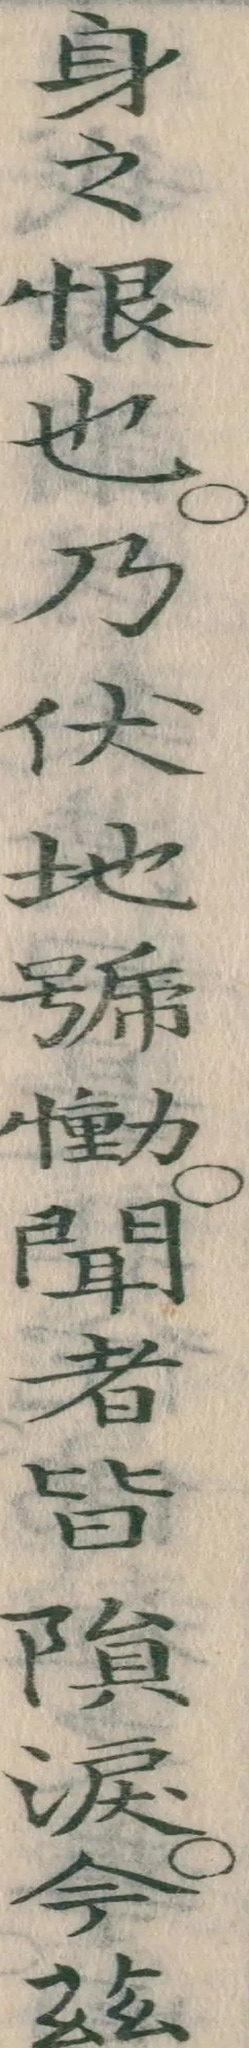身之恨也。乃伏地号慟。聞者皆隕淚。今茲
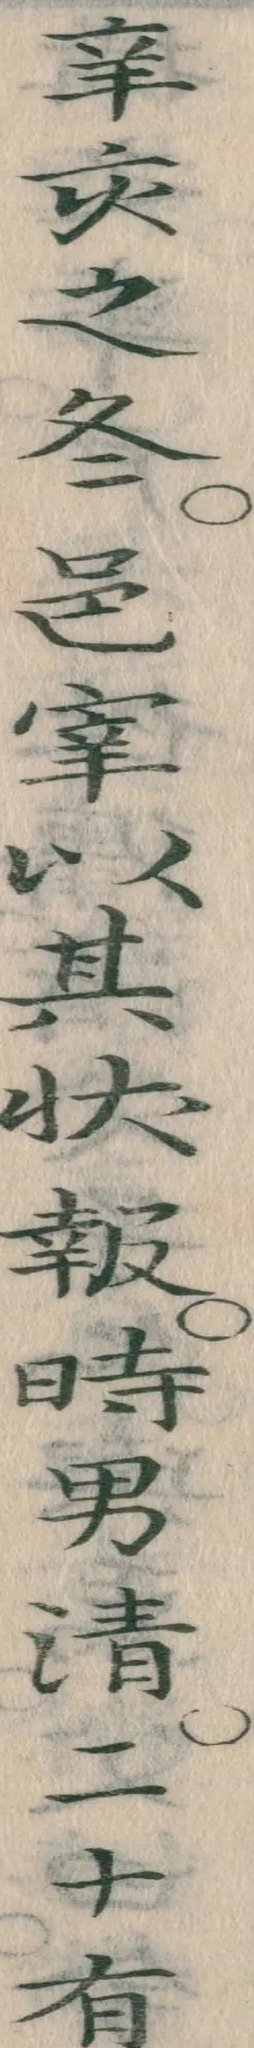辛㐪之冬。邑宰以其状報。時男清。二十有
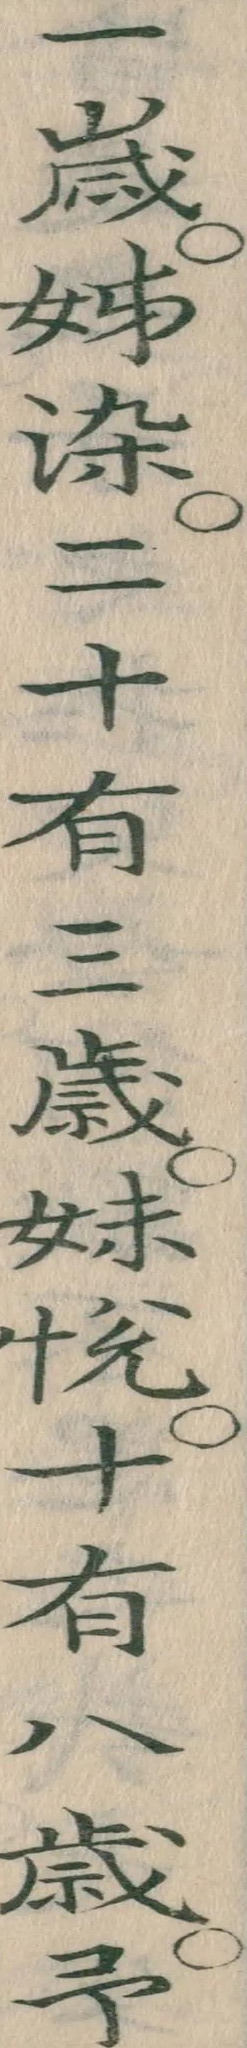一歳。姉染。二十有三歳。妹悅。十有八歳。予
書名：輪池叢書. 12
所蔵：国立国会図書館 National Diet Library, JAPAN
